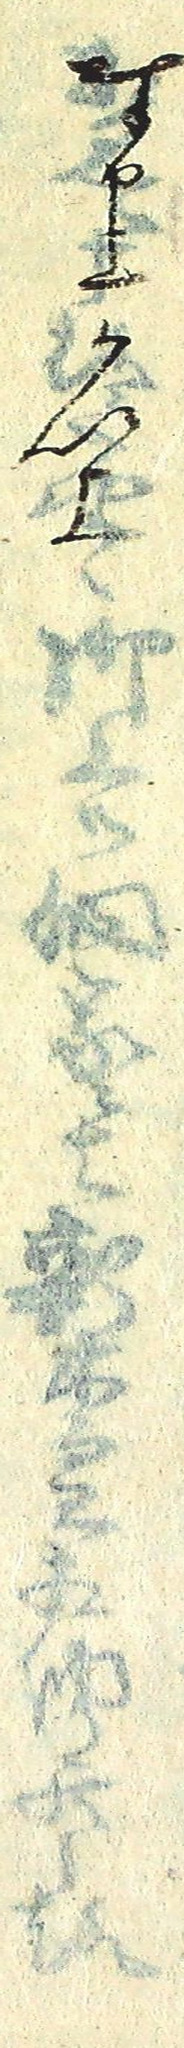奉申上候以上
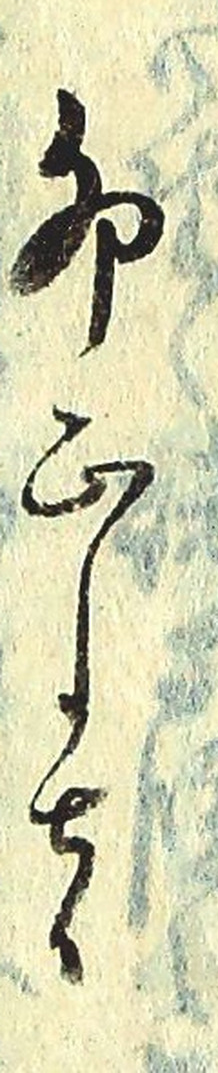卯正月七日
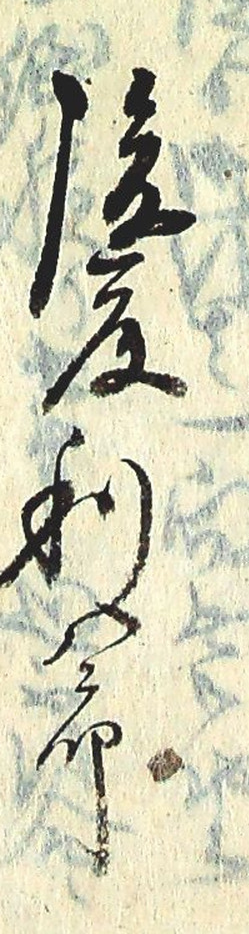後藤利八郎
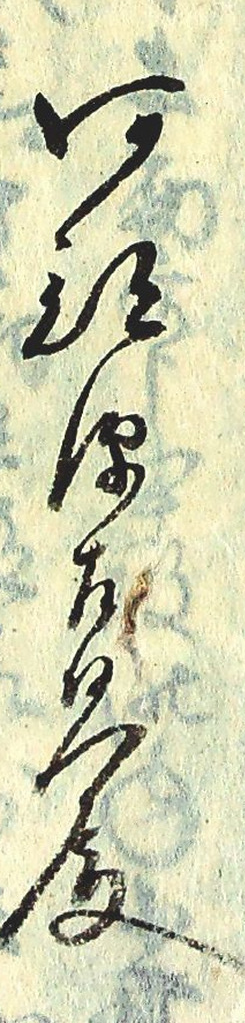阿部源左衛門殿

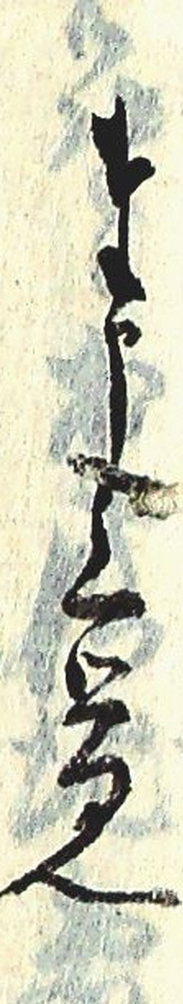奉申上覚
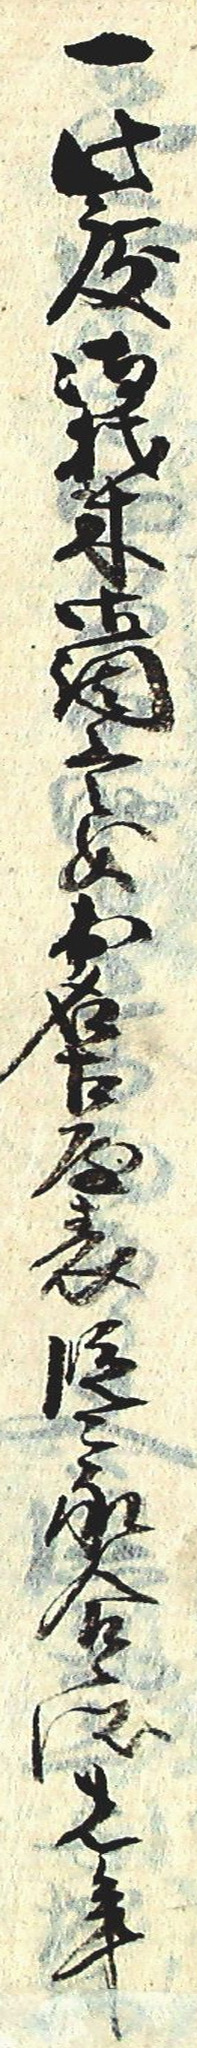一此度御材木御調上之義於名古屋表段々承合候所先年
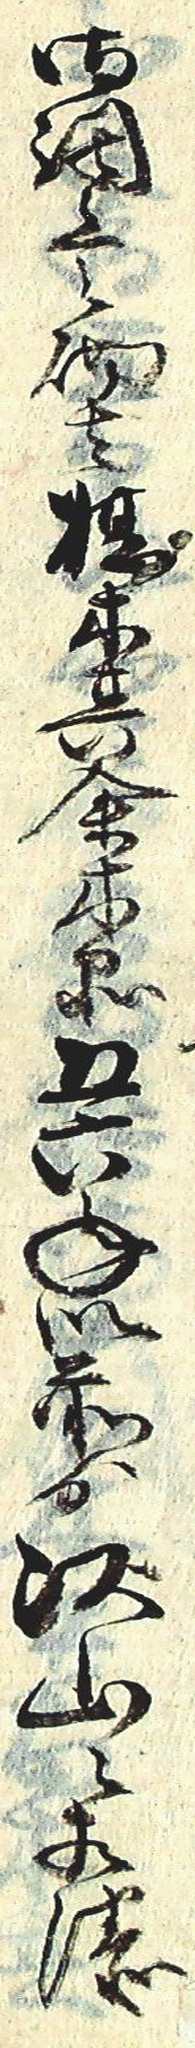御調上之砌は椹木其余木品五六年以前ゟ沢山に相湊
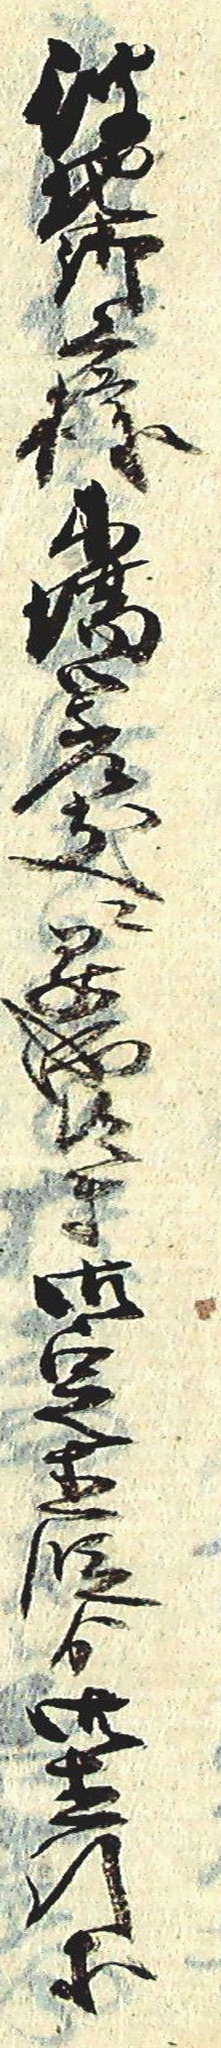彼地御上様木場御差支に罷成候に付御定直段ゟ御直引等
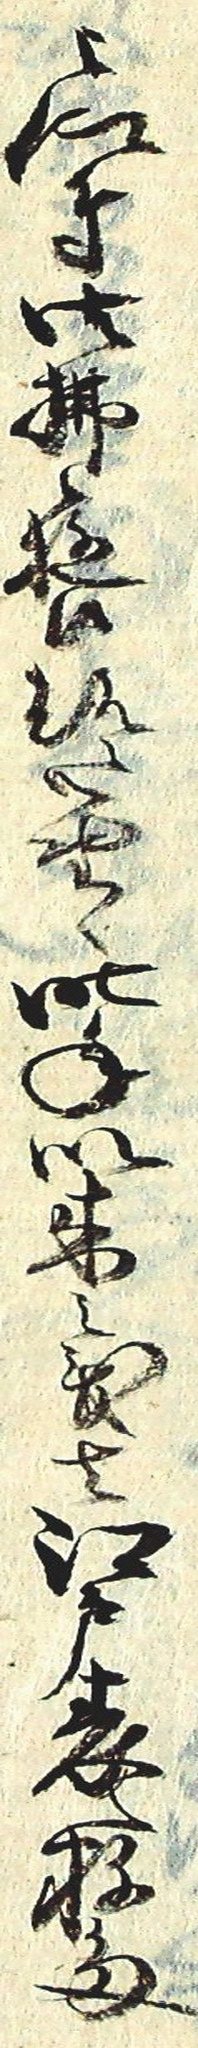被仰付御払被遊候趣に御座候昨年以来之義は江戸表へ数多
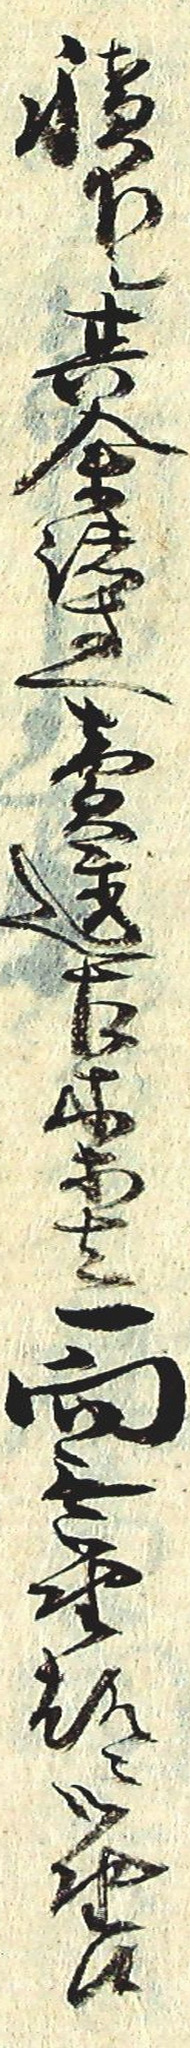積下し其余諸方へ売透古木等は一向無御座趣に御座候
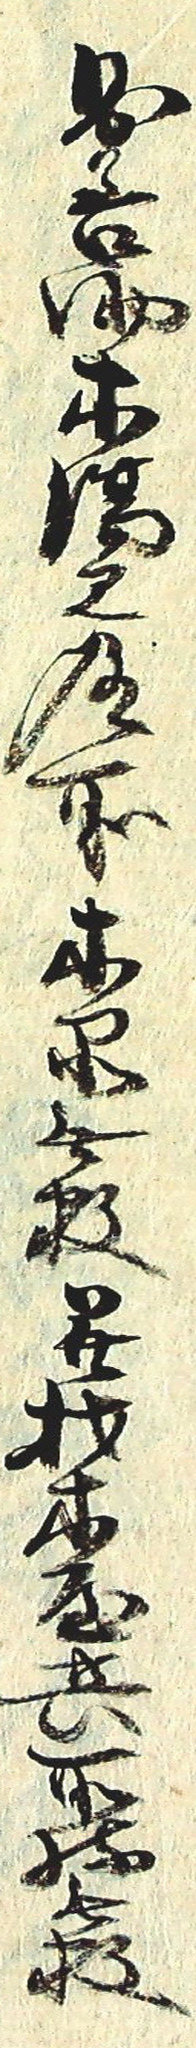則善助木場見及候所木品無数并材木屋共所持無数
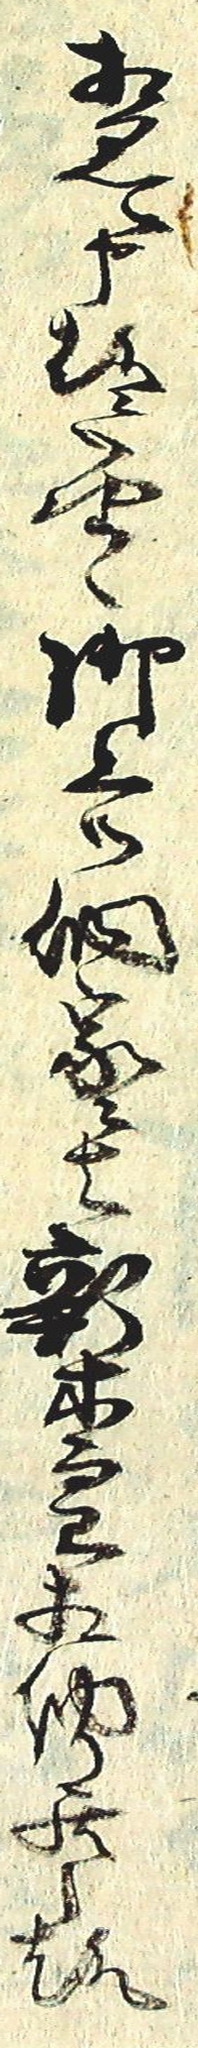相見へ申趣に御座候御上御納家には新木而已相納り居申趣
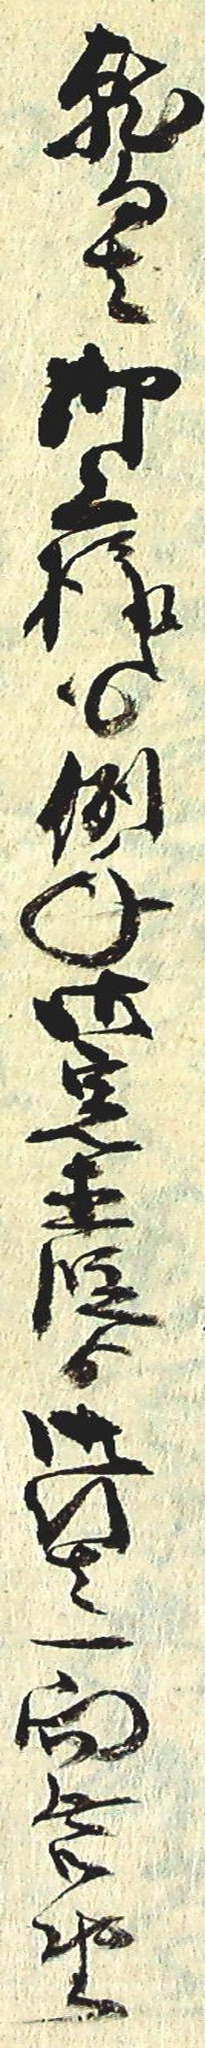就ては御上様へも例年御定直段ゟ御引は一向無御座
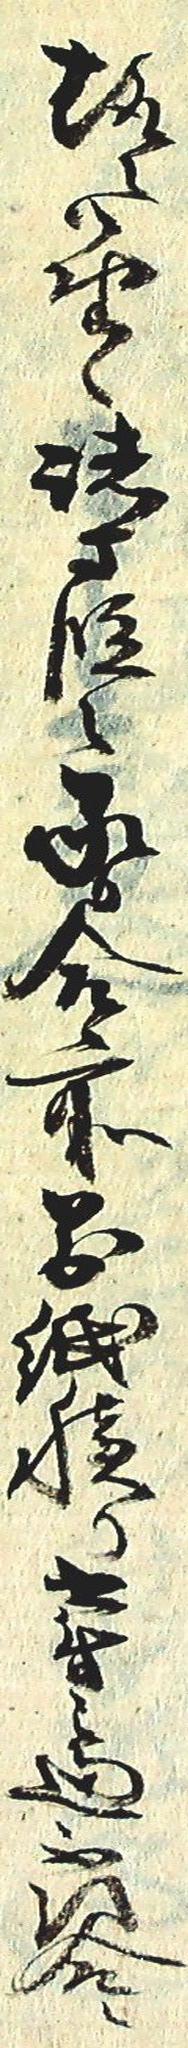趣に御座候諸方段々承合候所別紙積り書付之通不引合に
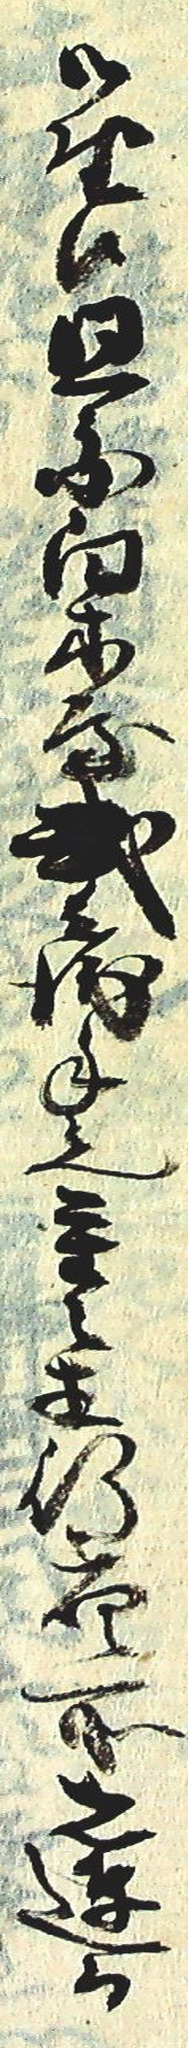御座候且亦白木屋武兵衛手元重々直行着候所先達て
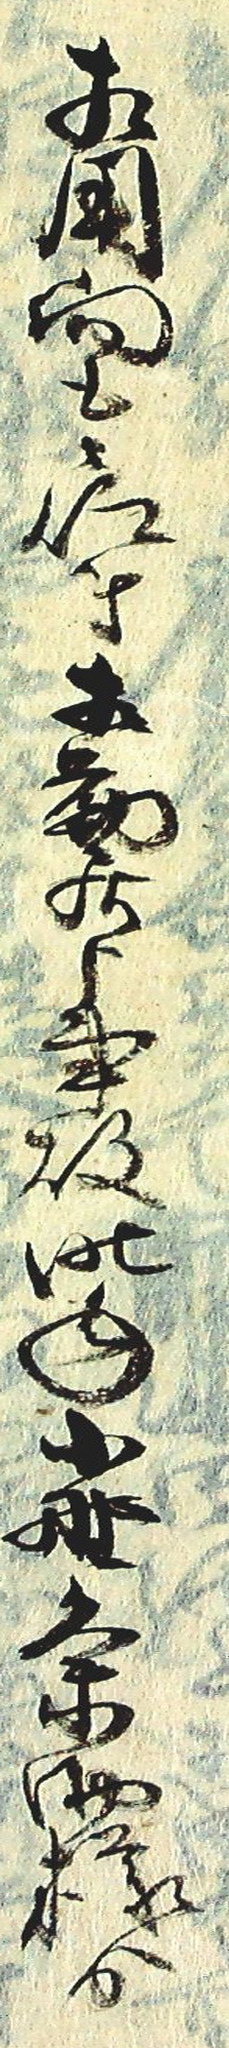相用向も被仰付相勤居申事故昨年小野久米助様ゟ
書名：諸御願書控(弐番）
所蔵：鳴門教育大学 Naruto University of Education
